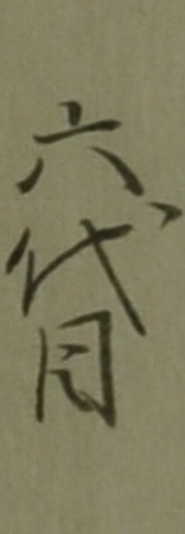六代目
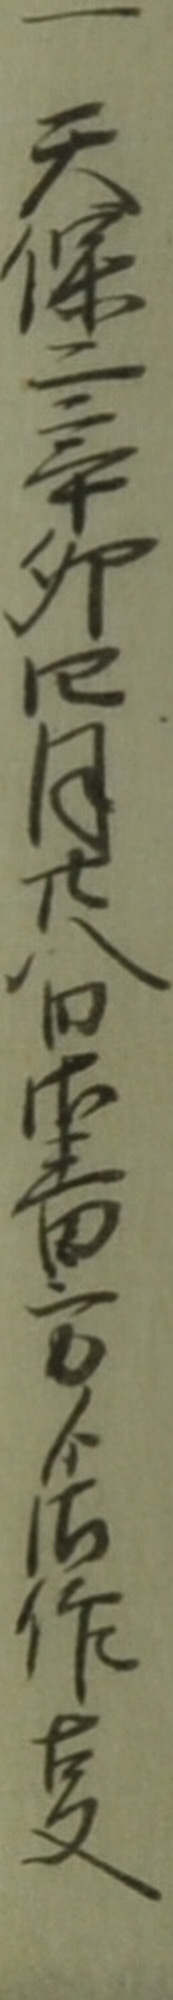一天保二辛卯四月廿八日御番方ゟ御作事
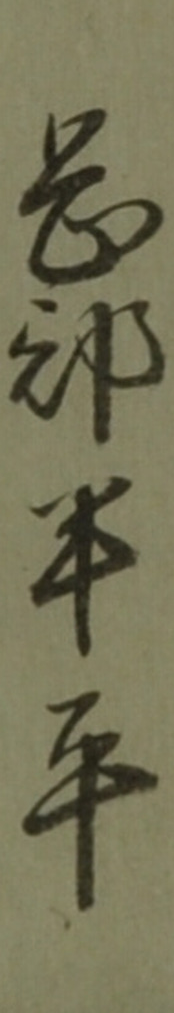岡部半平
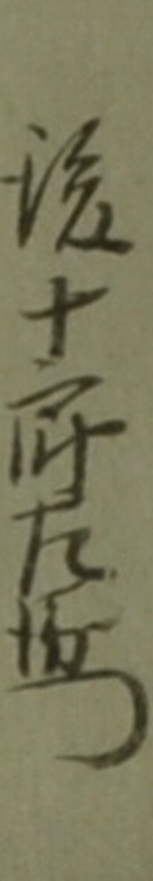後十郎左衛門

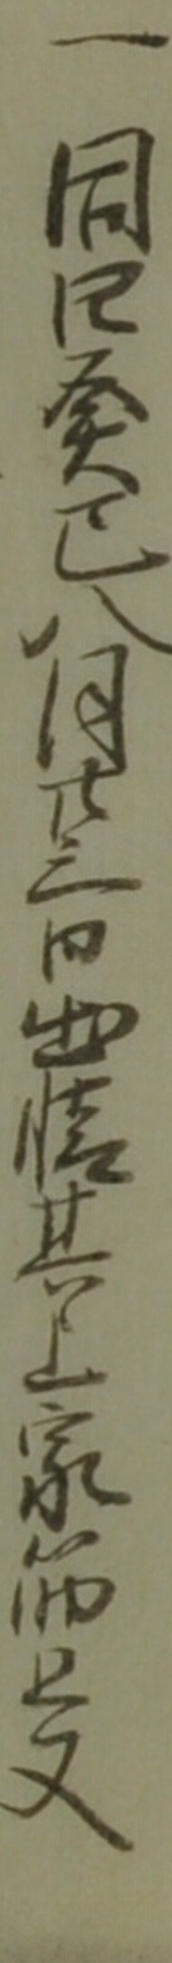一同四癸巳八月廿三日出精其上家筋且又
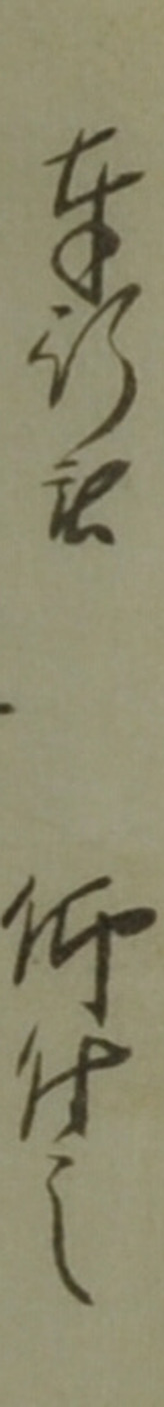奉行被仰付之
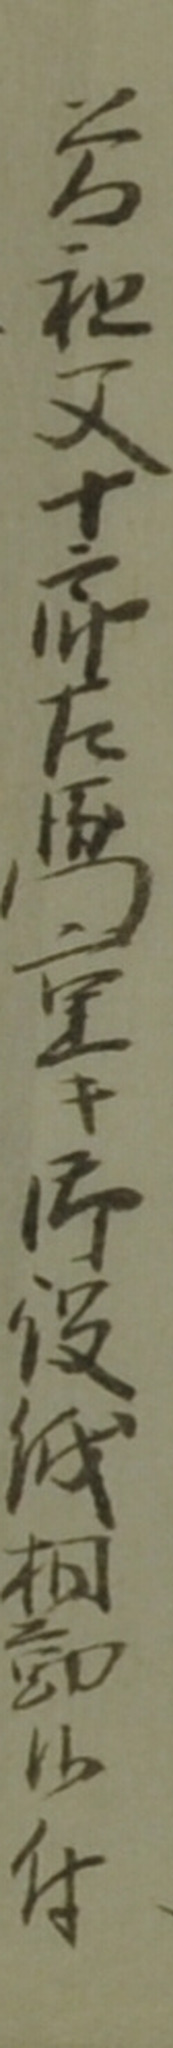曽祖父十郎左衛門重キ御役儀相勤候付

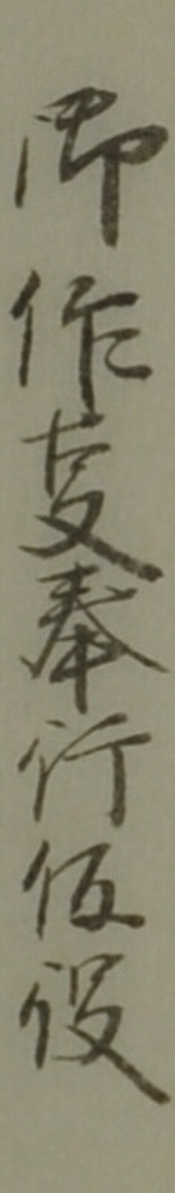御作事奉行仮役
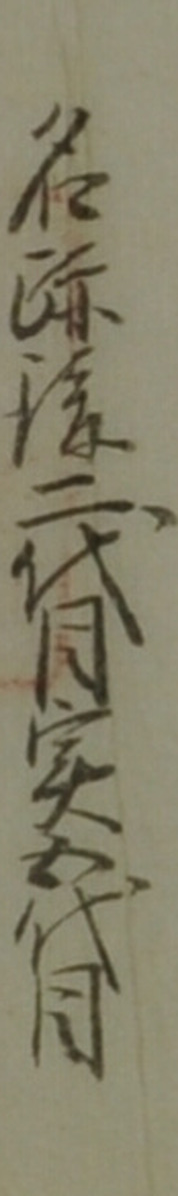名跡後二代目実五代目
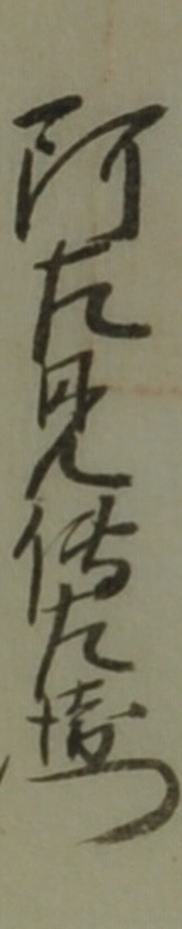阿左見伝左衛門
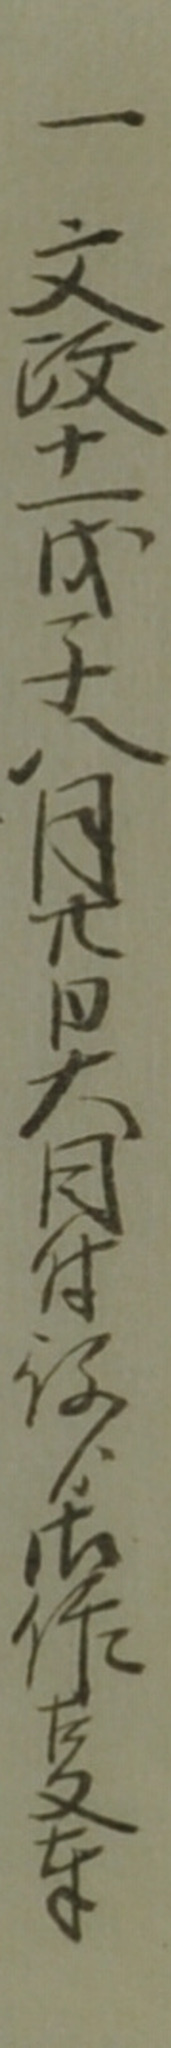一文政十一戊子八月廿日大目付役ゟ御作事奉
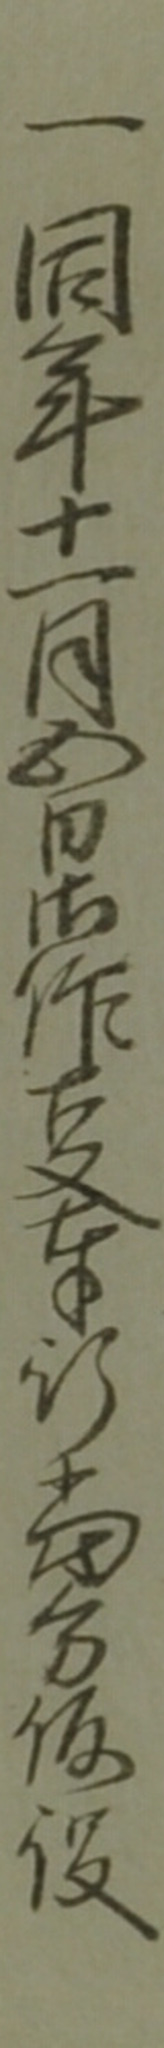一同年十一月五日御作事奉行当分仮役
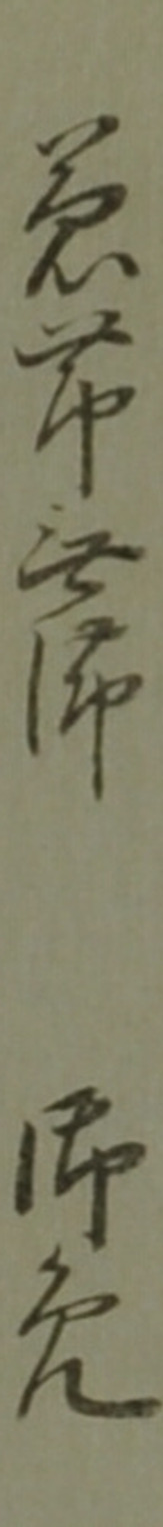兼帯無滞御免
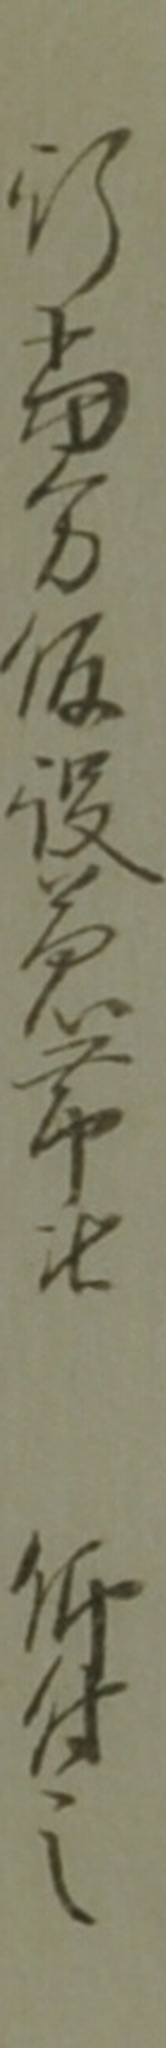行当分仮役兼帯被仰付之

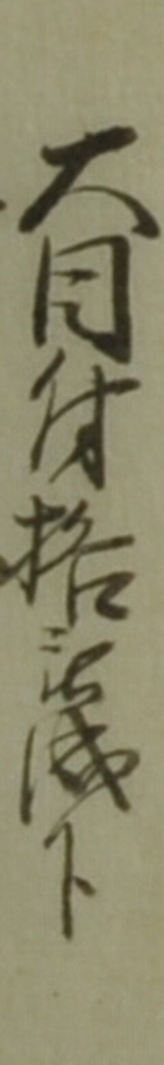大目付格被成下
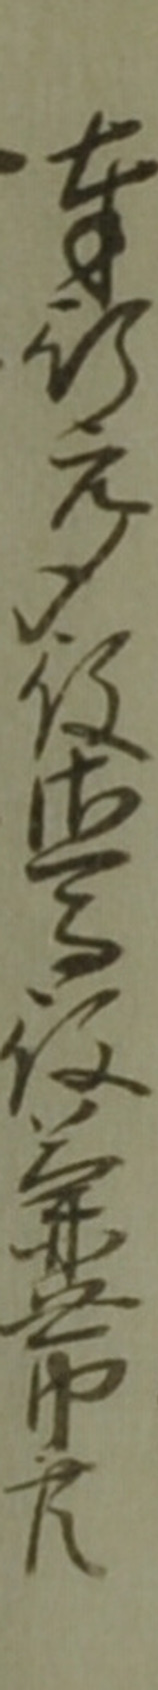奉行元〆役御馬役兼帯共
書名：諸御役代々録（六）
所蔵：伊那市立高遠町図書館・合同会社AMANE
